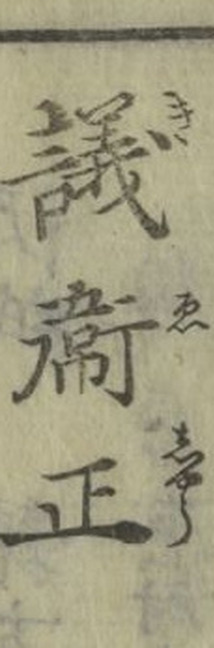議衛正
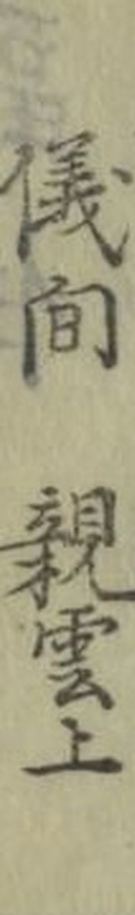儀間親雲上
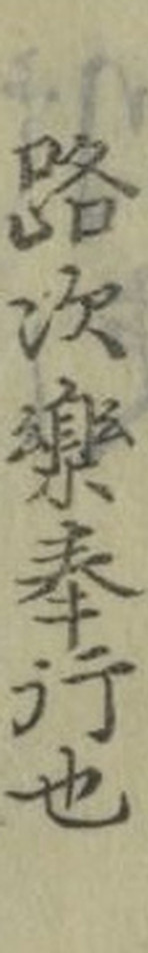路次楽奉行也
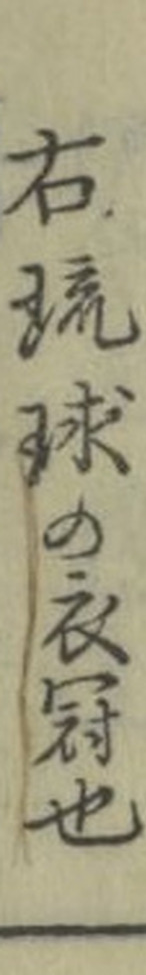右琉球の衣冠也
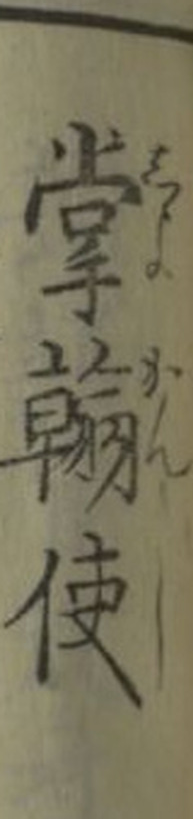掌翰使
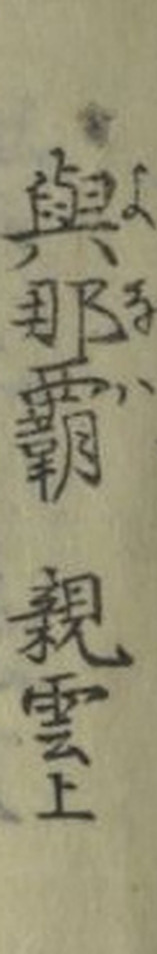與那覇親雲上
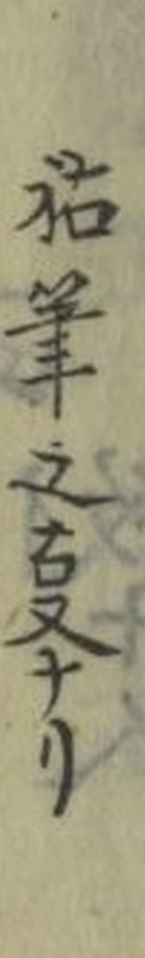祐筆之事ナリ
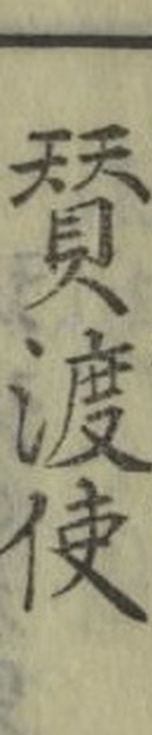賛渡使
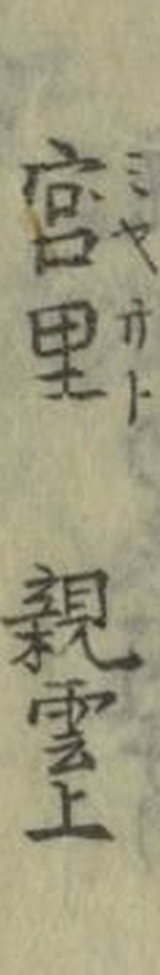宮里親雲上
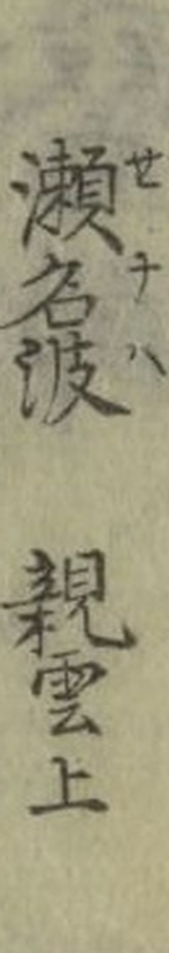瀬名波親雲上
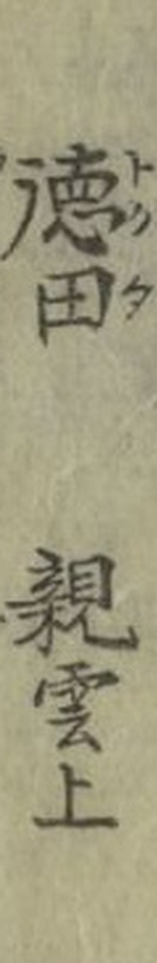徳田親雲上
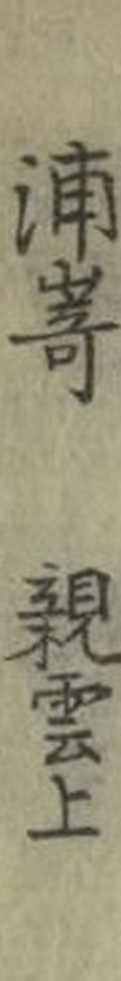浦嵜親雲上
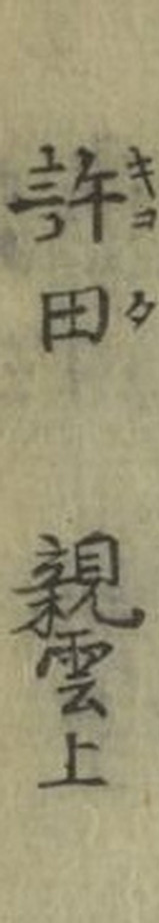許田親雲上

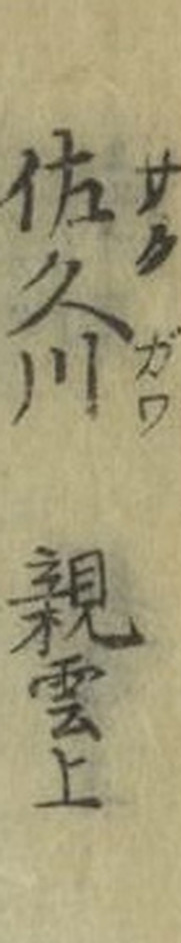佐久川親雲上
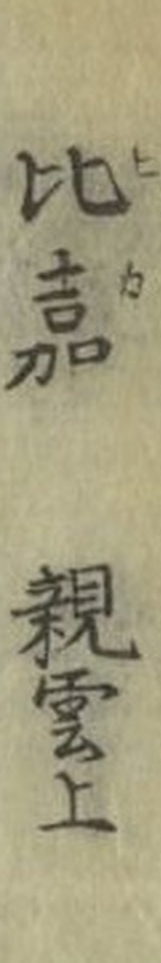比嘉親雲上
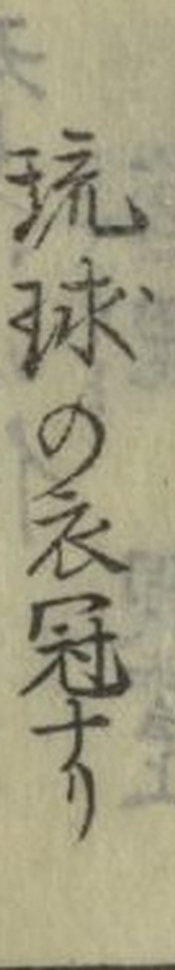琉球の衣冠ナリ
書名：琉球人行列記
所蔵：University of the Ryukyus Library
